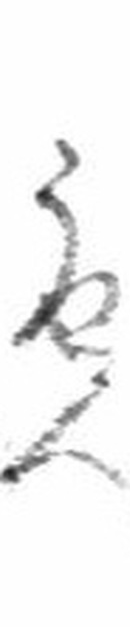うせ人
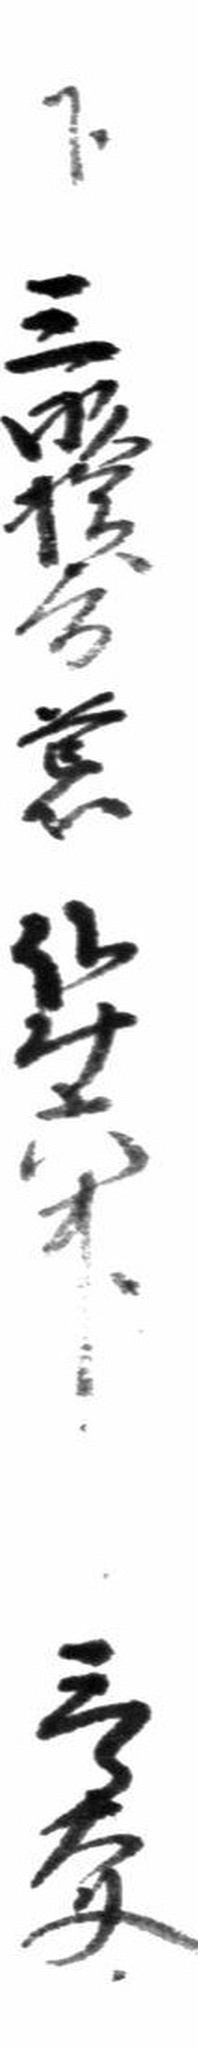下三畝拾歩荒弐斗六升三郎大夫
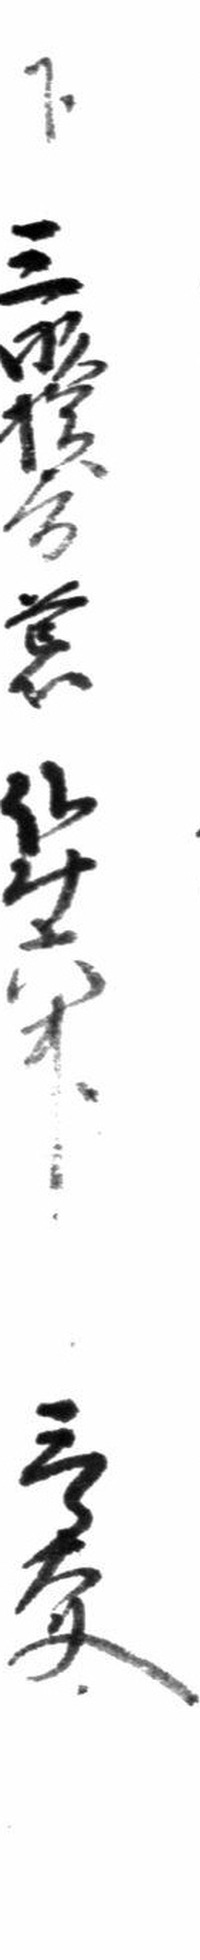下三畝拾歩荒弐斗六升三郎大夫
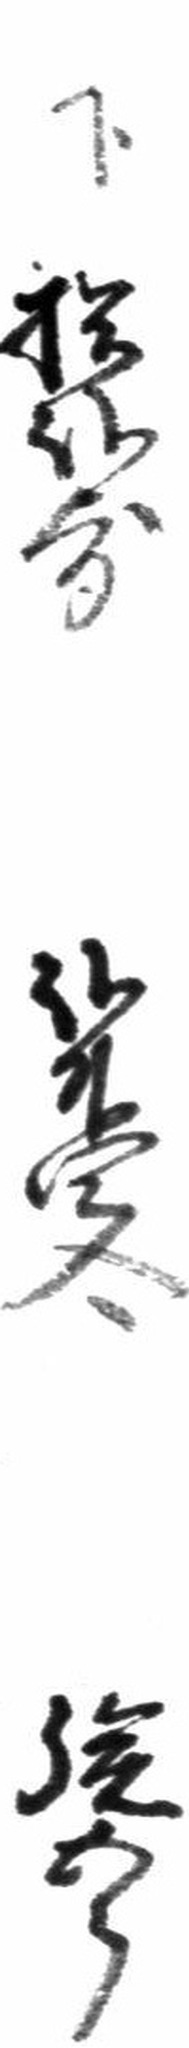下拾弐歩弐升四合孫五郎
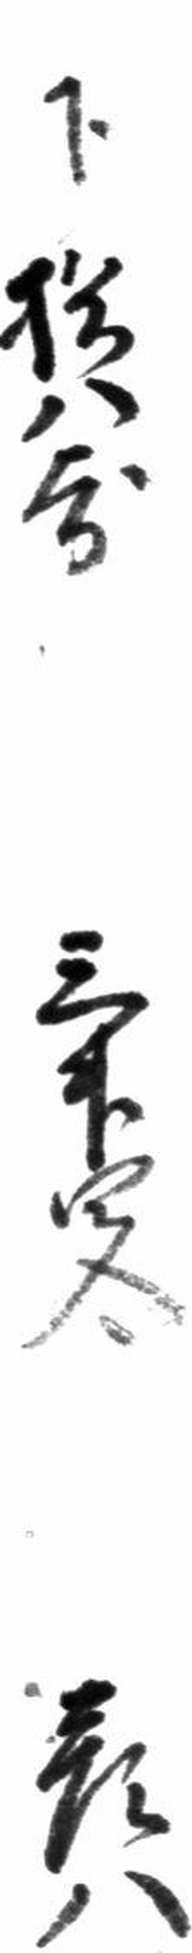下拾八歩三升四合彦八
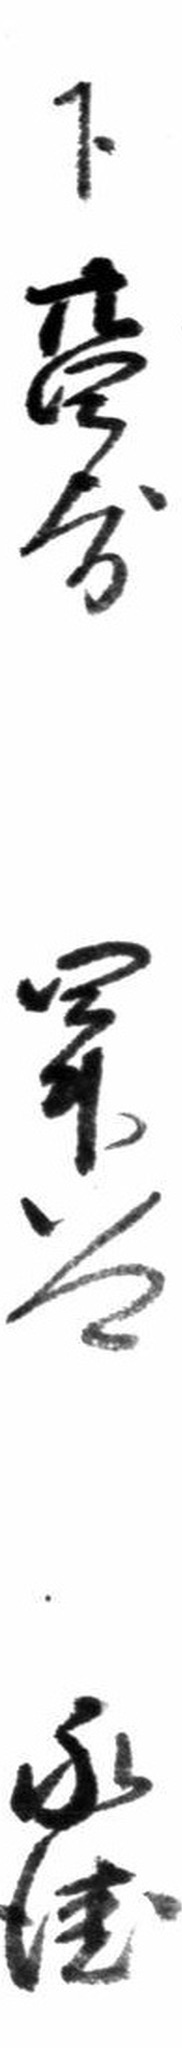下廿四歩四升八合永徳
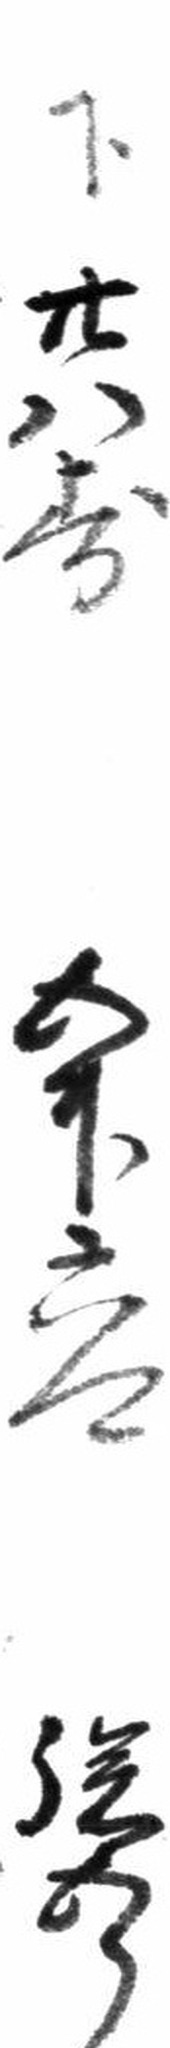下廿八歩五升六合孫五郎
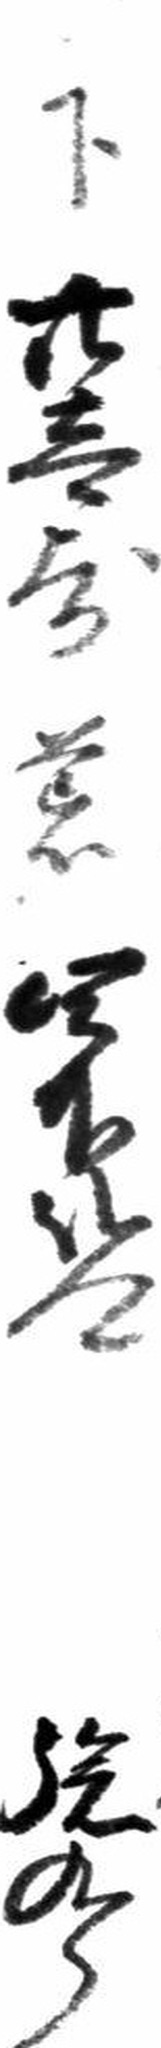下廿壱歩荒四升弐合孫九郎
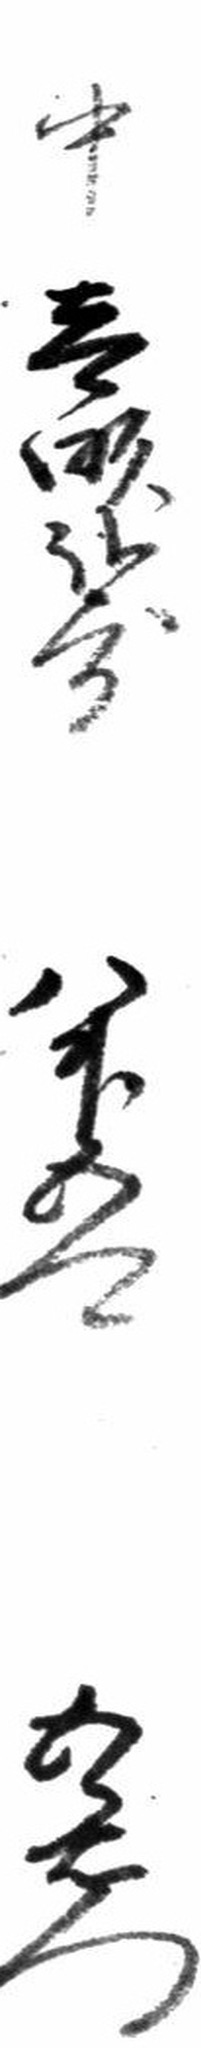中壱畝弐歩八升五合五郎右衛門
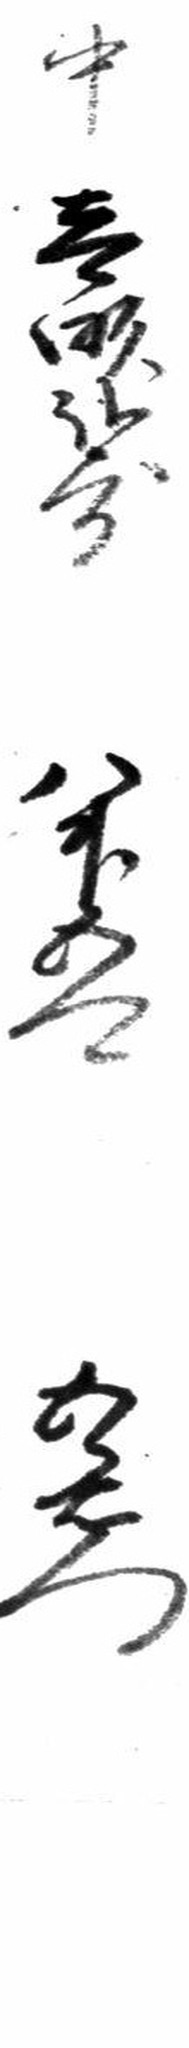中壱畝弐歩八升五合五郎右衛門
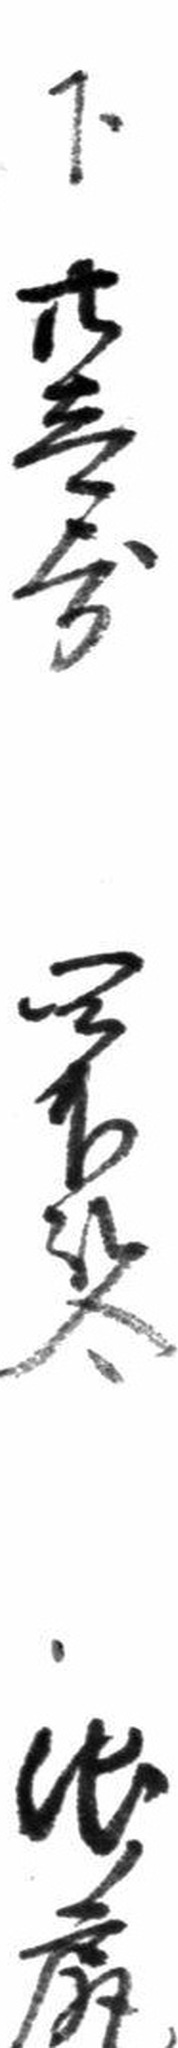下廿壱歩四升弐合池ノ尻

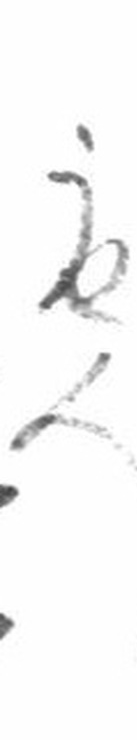うせ人
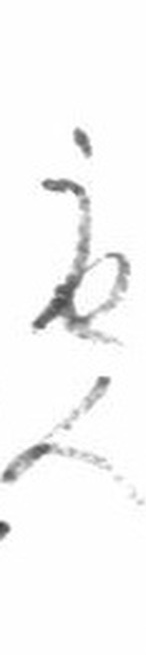うせ人
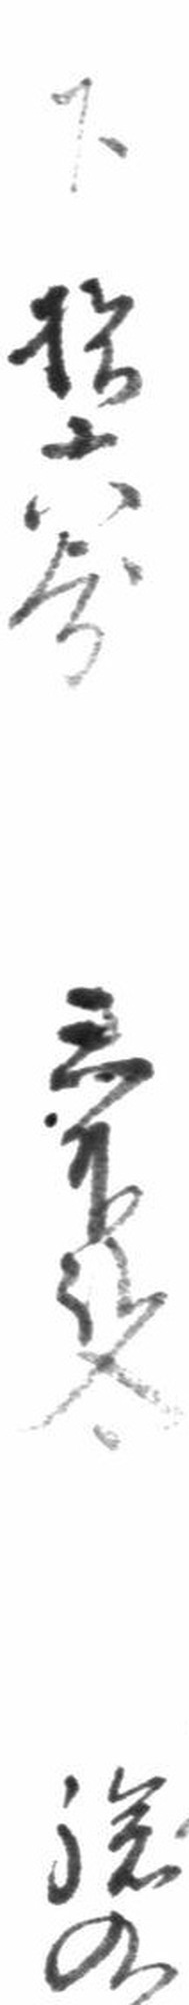下拾六歩三升弐合孫九郎
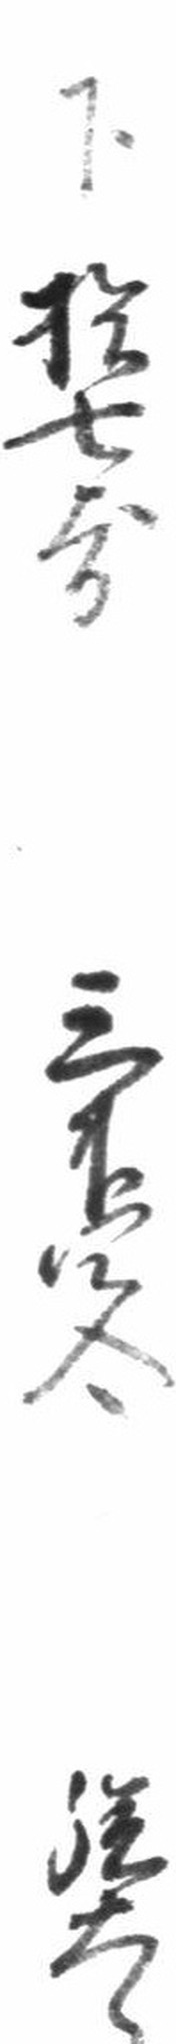下拾七歩三升四合孫大郎
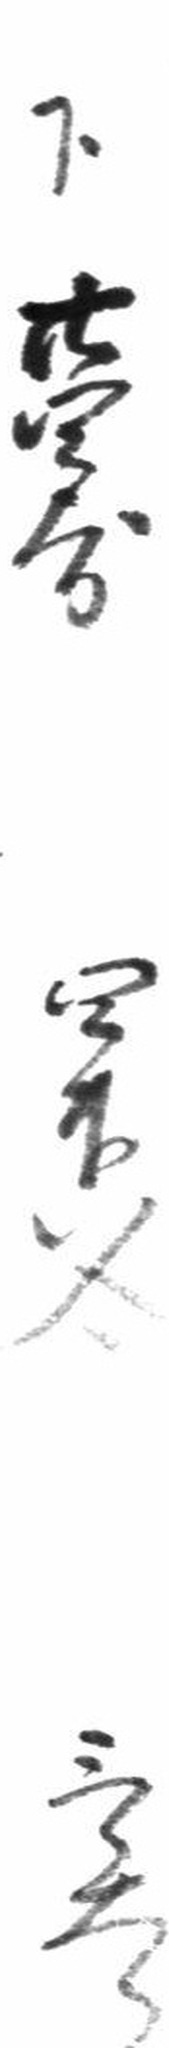下廿四歩四升八合三郎大郎
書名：若州三方郡之内世久見浦御検地帳（世久見浦検地帳写）
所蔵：福井県文書館 Fukui Prefectural Archives
